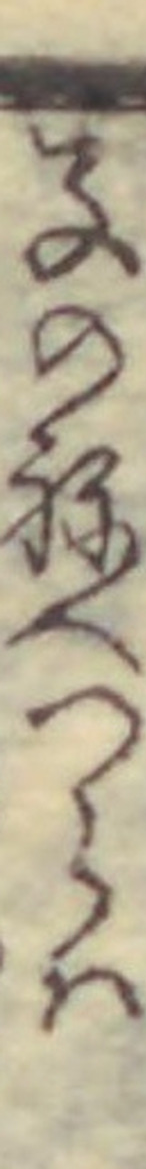子のねへつらは
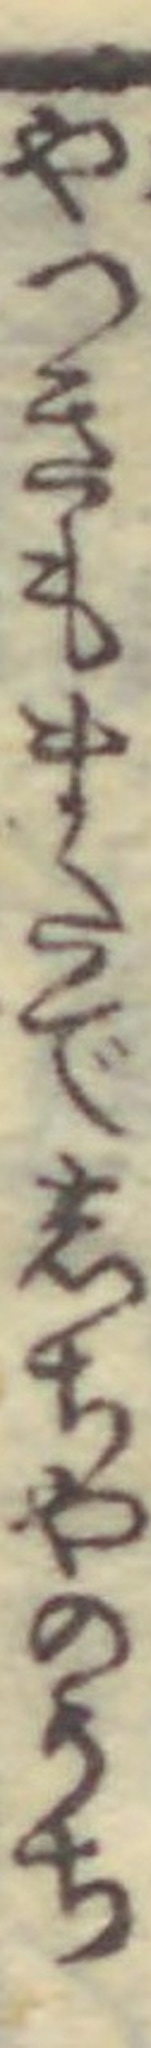やつきもまたでしちやのうち
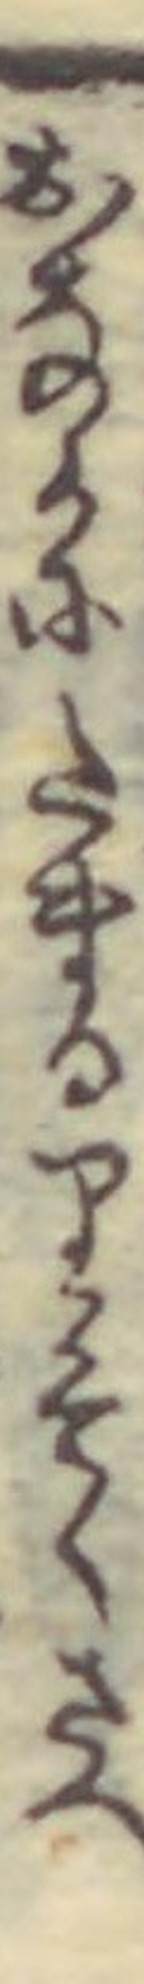おなかにたまるりそくさへ
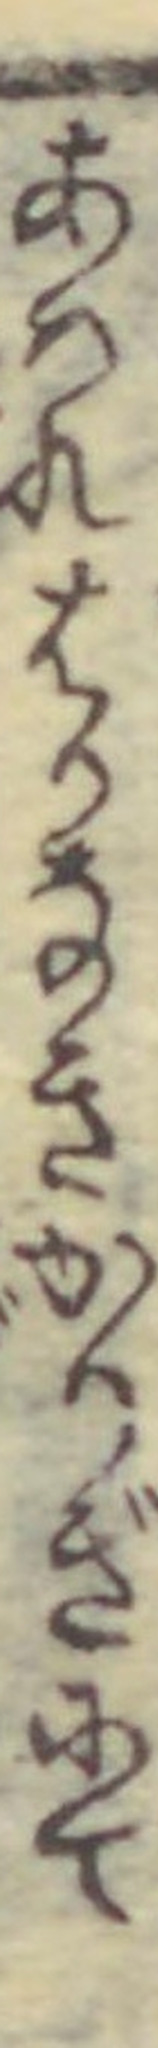あはれはかなきかりぎにて
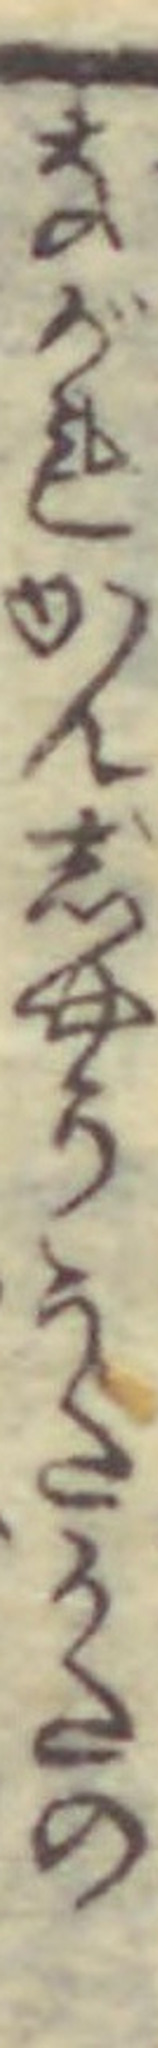ながれかんじやううたかたの
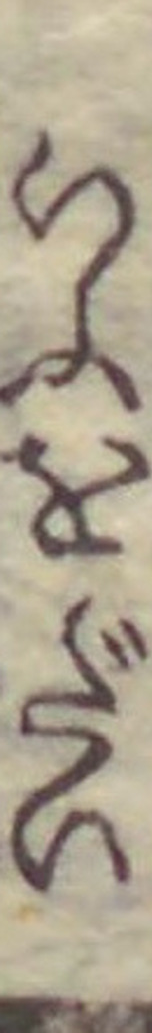いふをだい
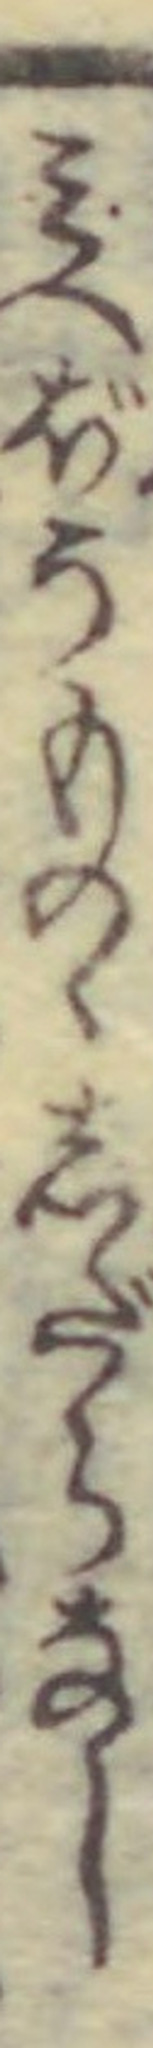みへぼうものゝしだらなし
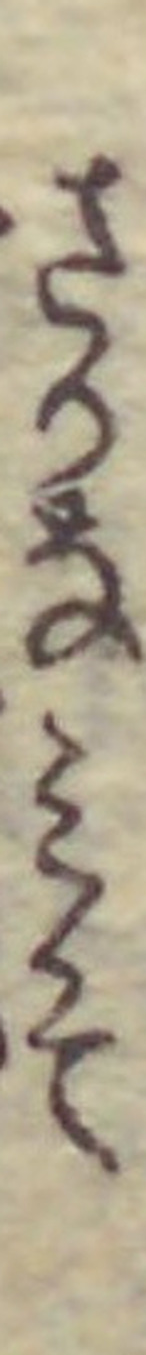さかなみそ
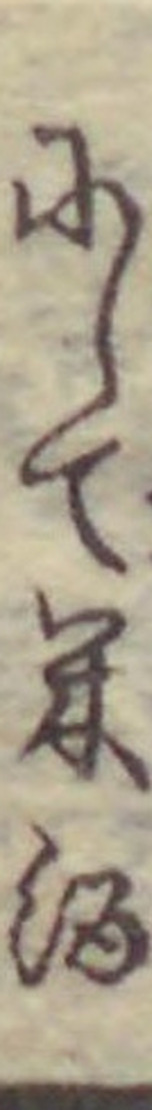にして米酒
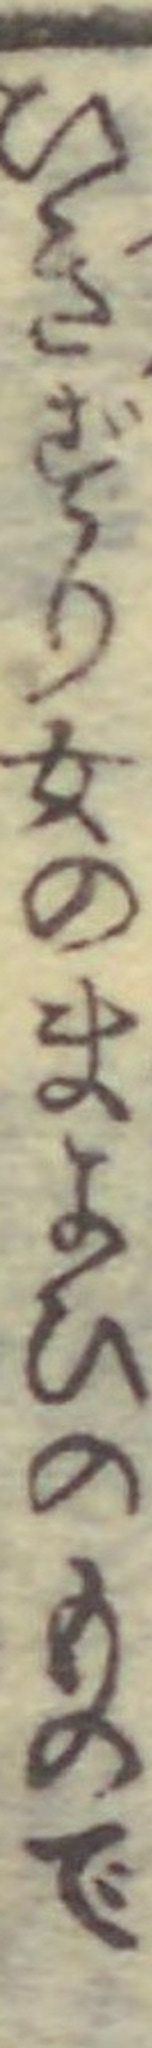ひきずり女のまよひのもので
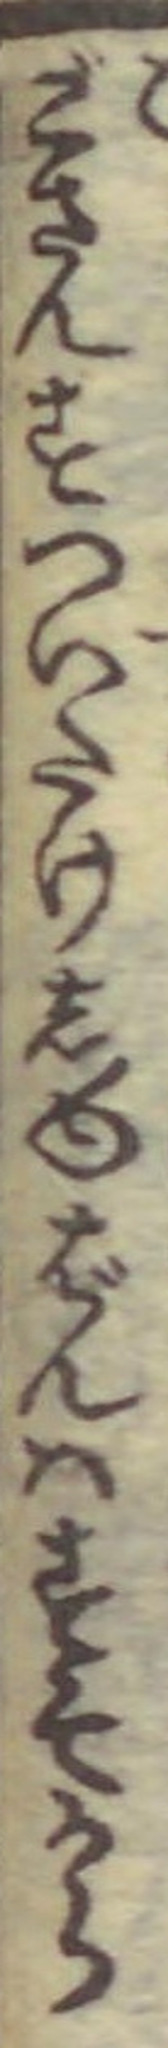ごさんすついたけしゆばんはすそから
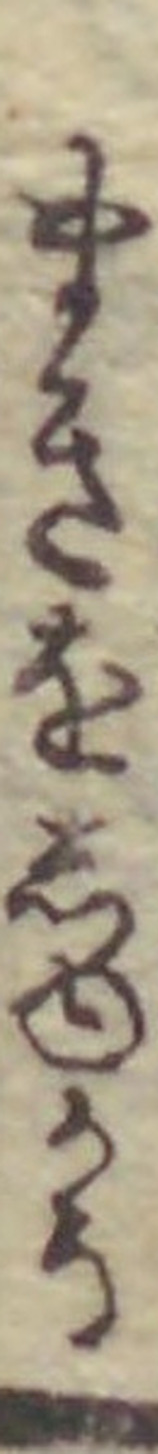まきをしゆかう
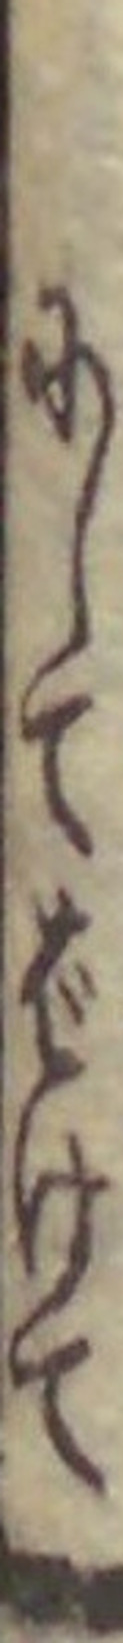にしてばけて
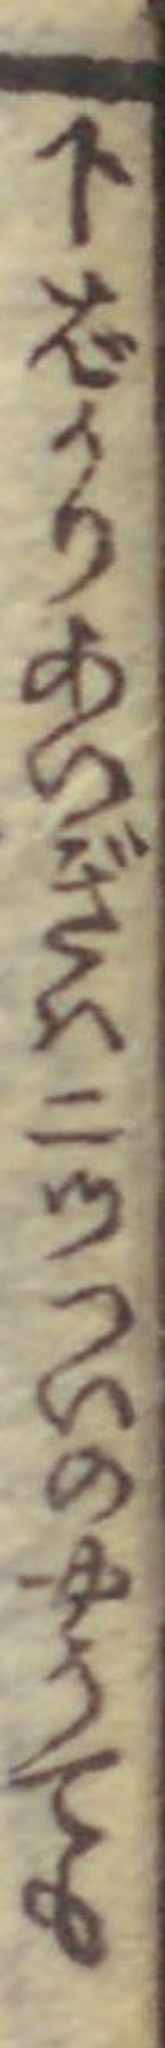下ばかりあいぎは二つついのやうても
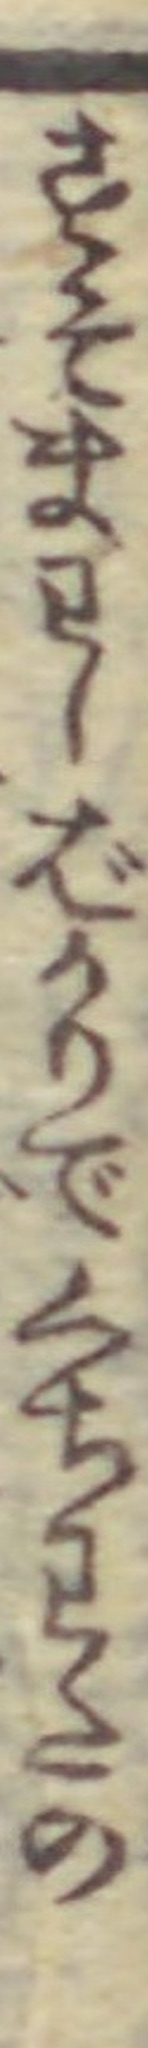すそまわしばかりでくちわたの
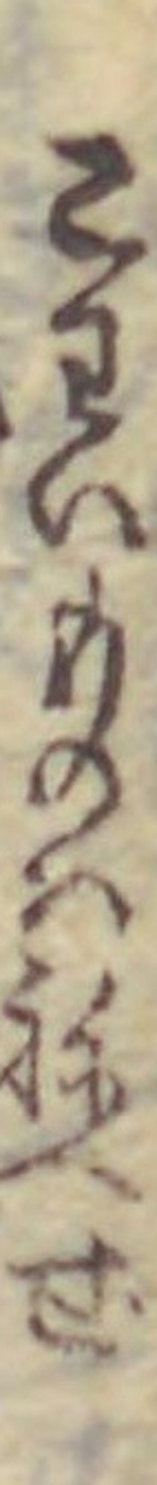こわいものはねへせ
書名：大時代唐土化物 3巻. 曽我太夫染
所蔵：国立国会図書館 National Diet Library, JAPAN
